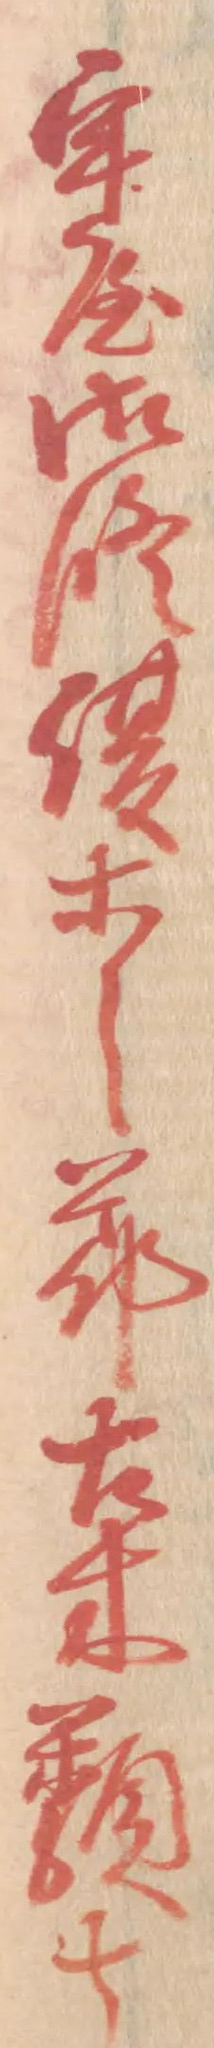「牢屋御修復等之節古木類は
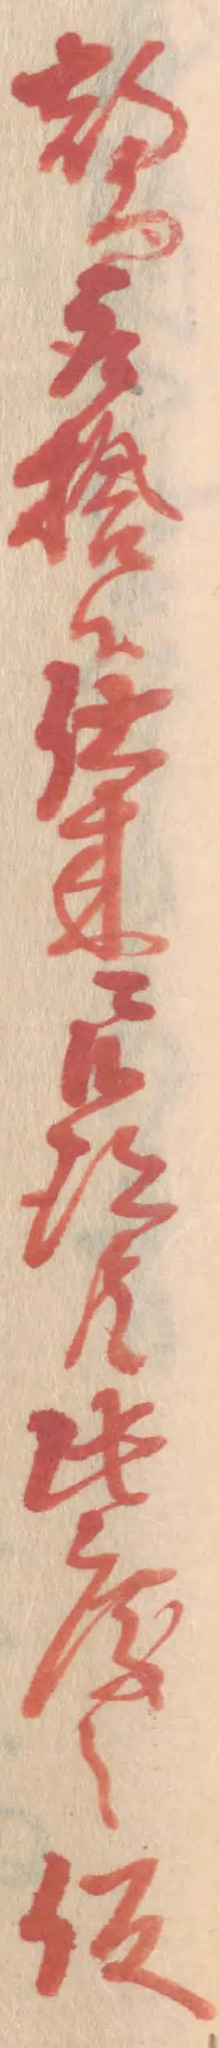都て取捨候仕来ニ候得共此度之仮
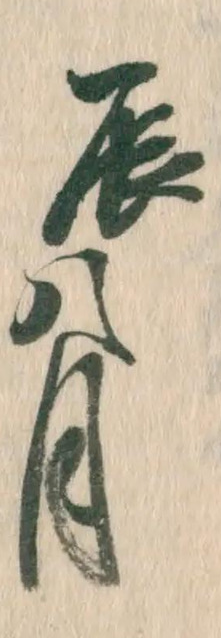辰八月

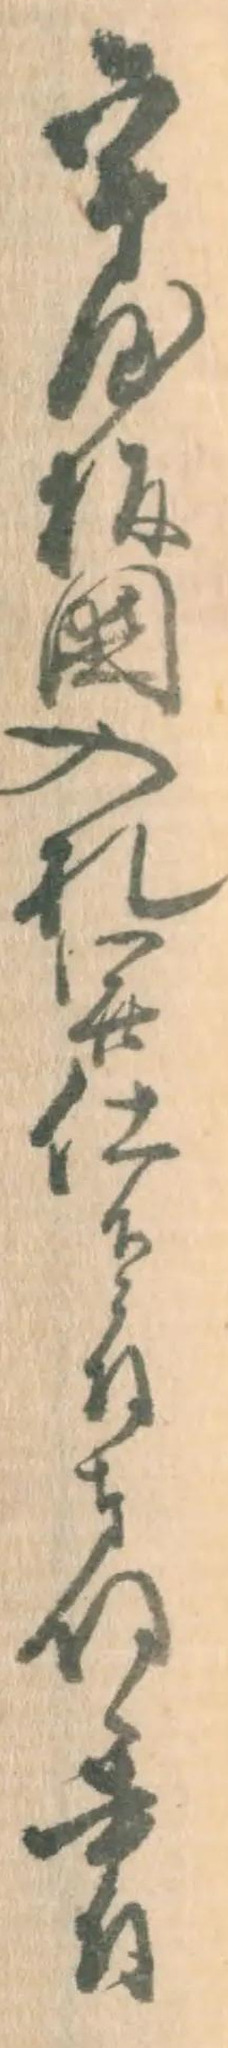牢屋板囲入札開仕候ニ付奉伺書付
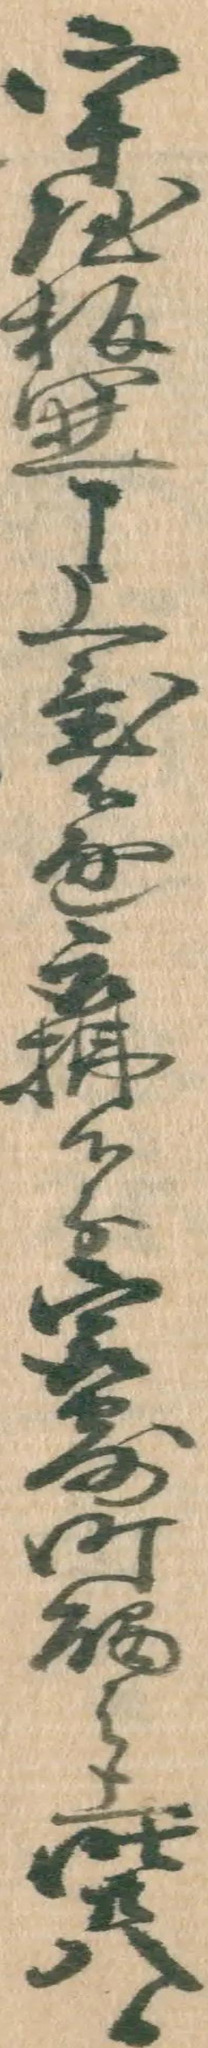牢屋板囲申上置候通取払候分最寄町触聞昨廿八日
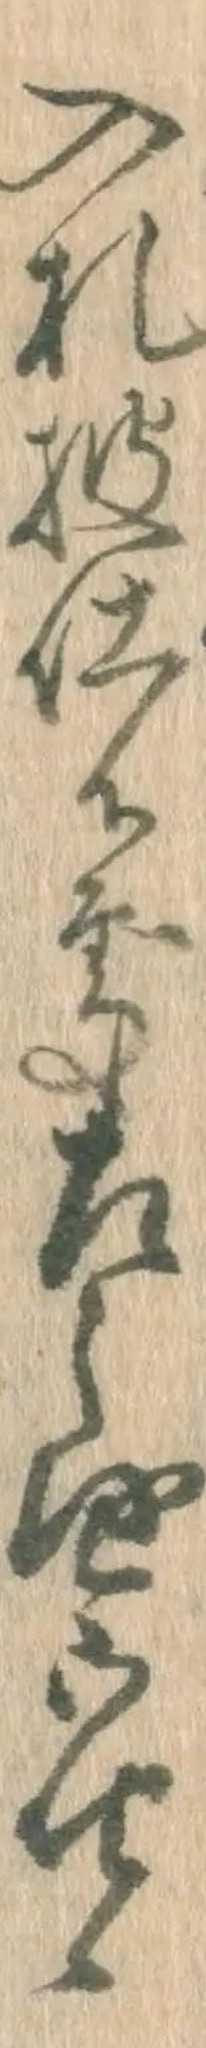入札被仕候処左之通御座候
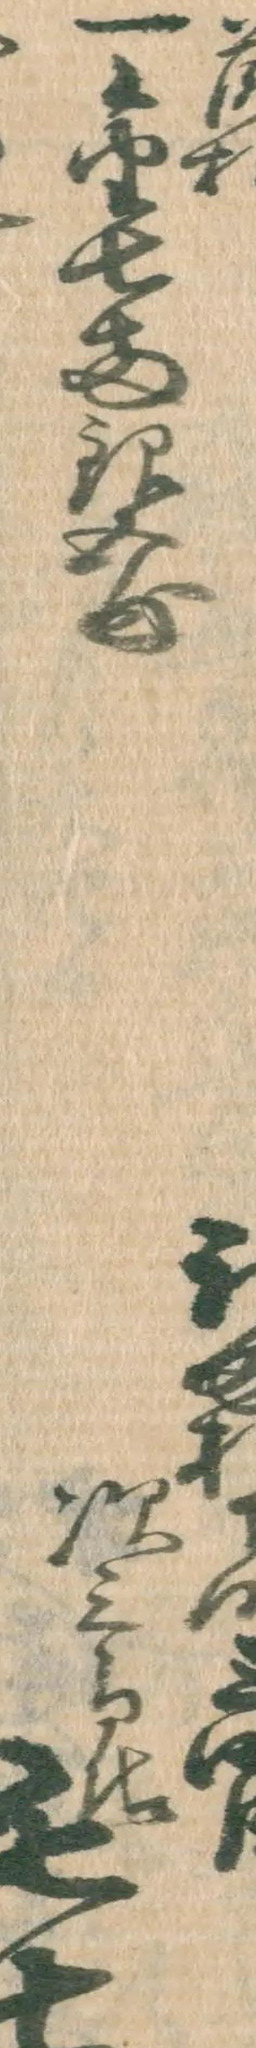一金七両銀五匁次三郎店
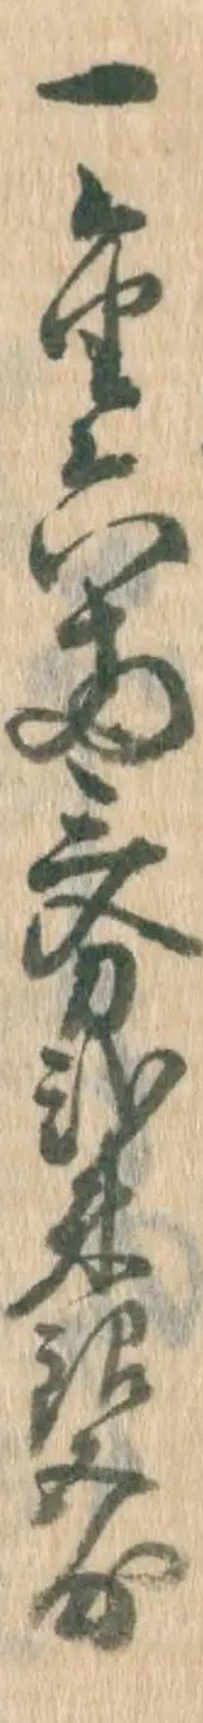一金六両三分弐朱鉄五郎
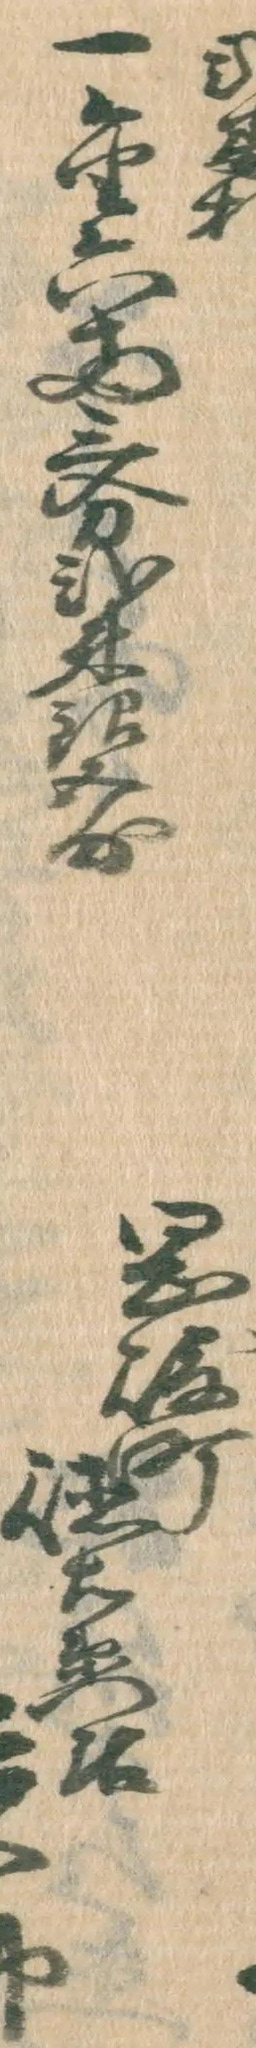一金六両三分弐朱銀五匁徳右衛門店
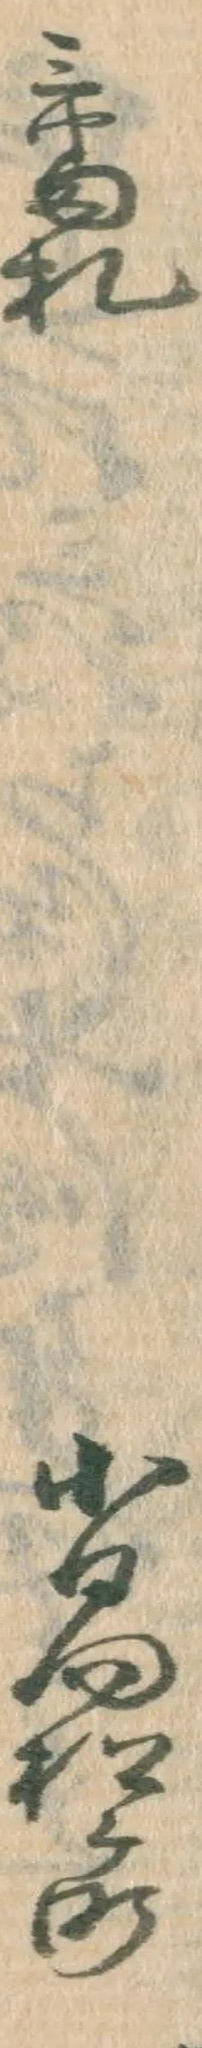三番札小日向松ケ町
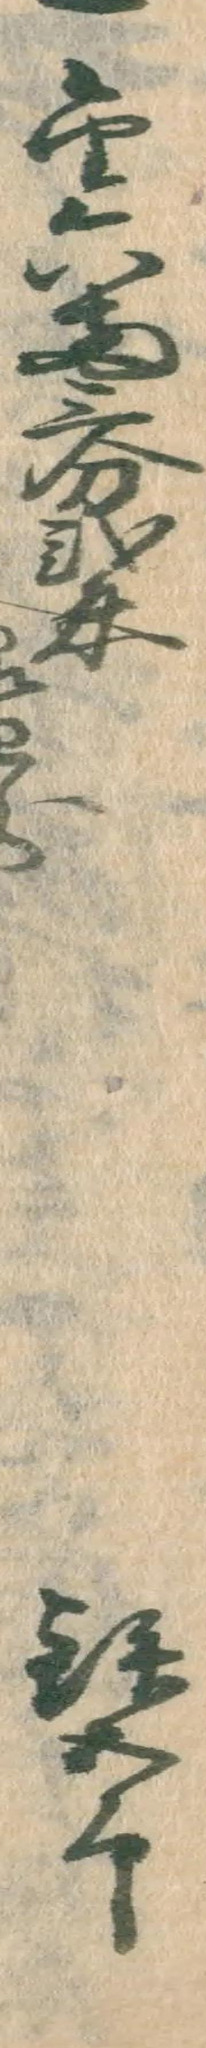一金六両三分弐朱鉄五郎
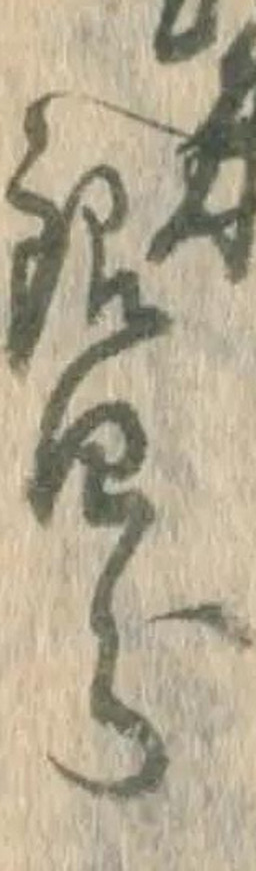銀四匁

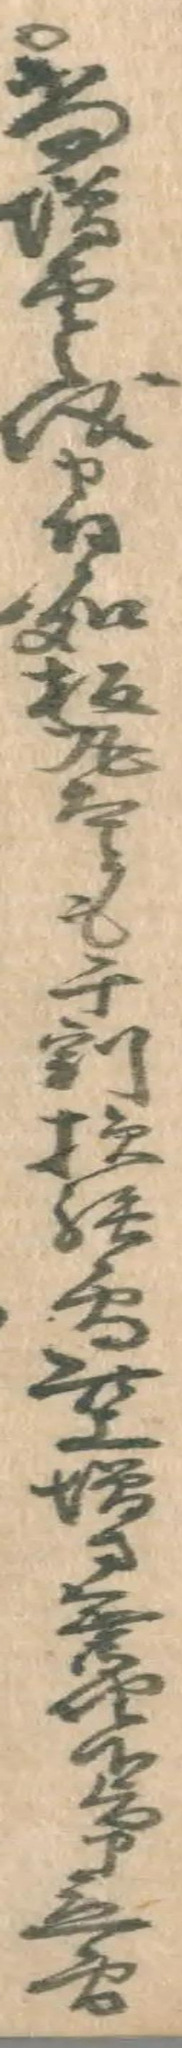∘尚増金之儀申付候処板丸太とも干割損強候間此上増方無御座候旨申立候間
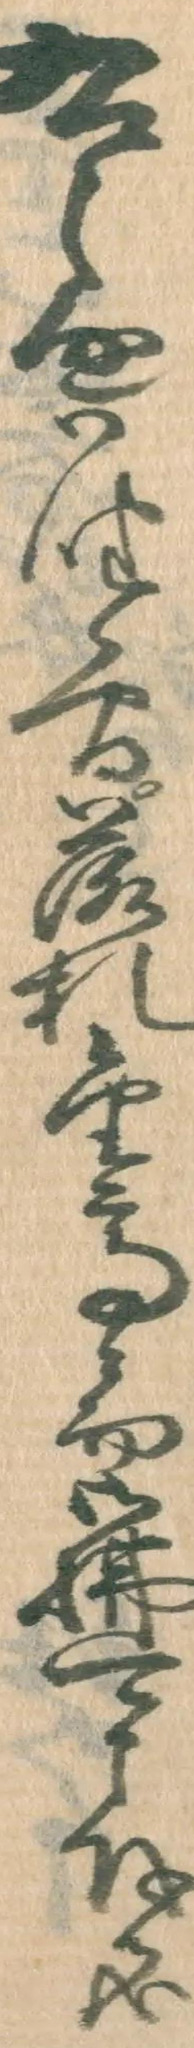右之通御座候間∘落札金高ニて御払可申付候哉
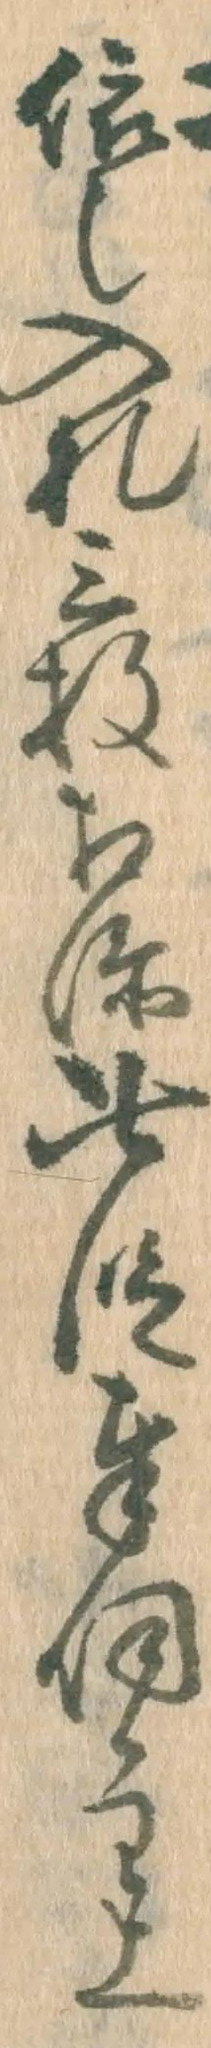依之入札三枚相添此段奉伺候已上
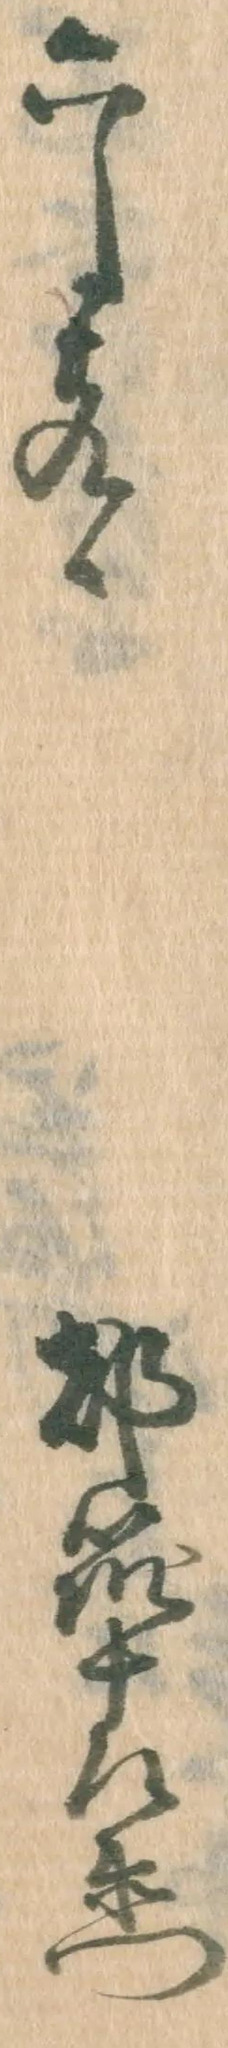六月二十九日都筑十左衛門
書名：七十冊物類集 71巻. [44] 四十三 牢屋敷御普請御修覆地震ニ付骨折候牢屋掛御褒美之部
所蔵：国立国会図書館 National Diet Library, JAPAN
